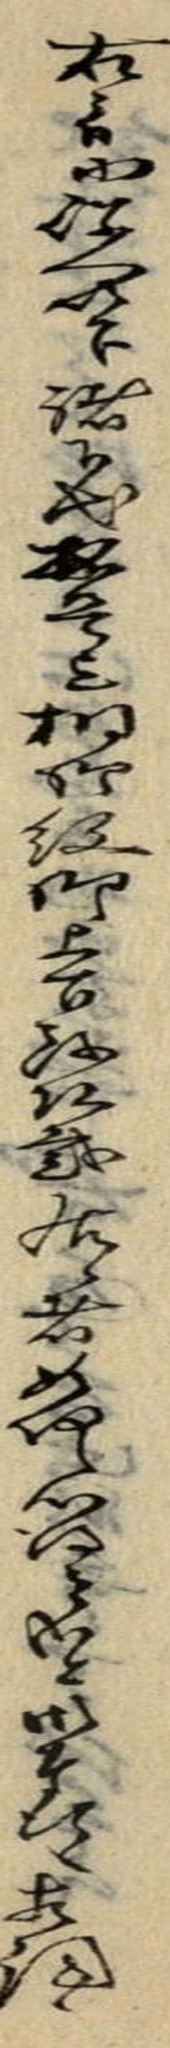右に付小役人以下諸下代抔是迄桐御紋御上下致頂戴居候者如何之心得に候哉と御奉行へ相調候
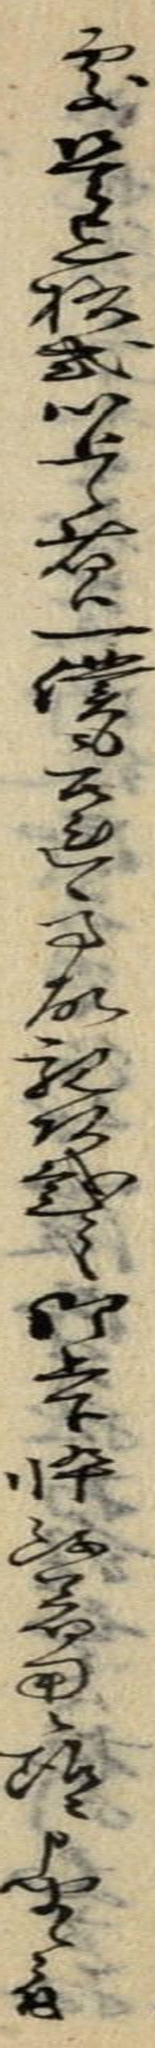処是迄格式以上之者は一僕も召連候事故親頂戴有之御上下忰致着用之趣に申聞候に付
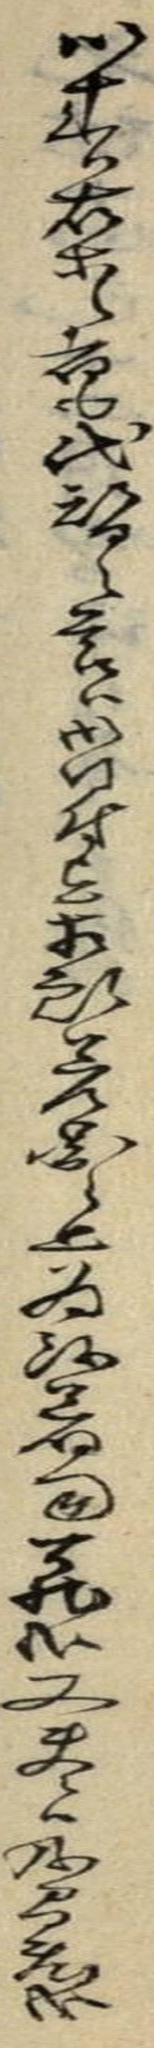以来は右等之者も代替之節は御目付迄相願指図之上為致着用可然哉又夫々は及間敷哉
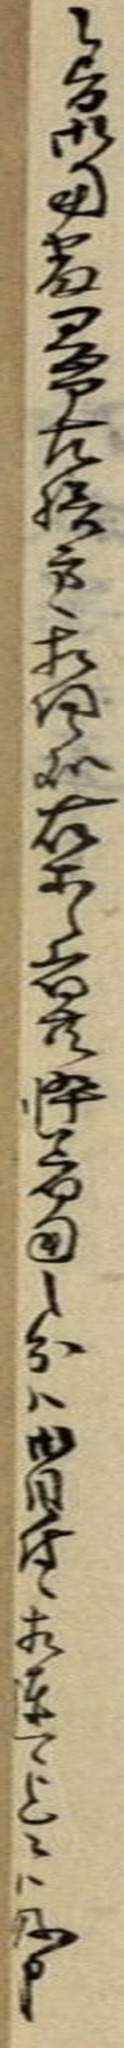之旨御用番岡部左膳方へ相伺候処右等之者共忰着用之分は御目付へ相達候迄には及申
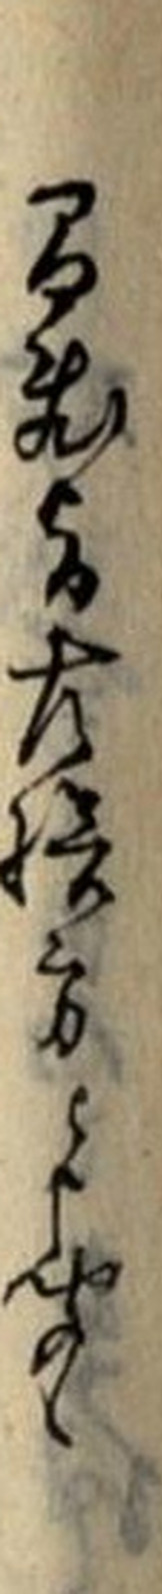間敷旨左膳方被申聞候
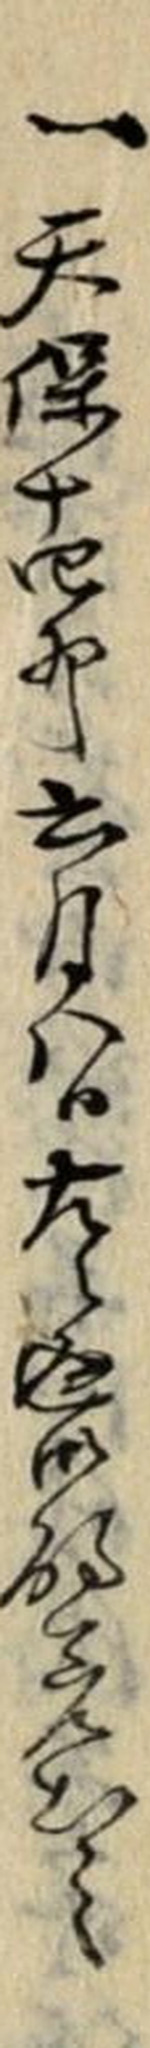一天保十四卯六月八日左之通御触差出之
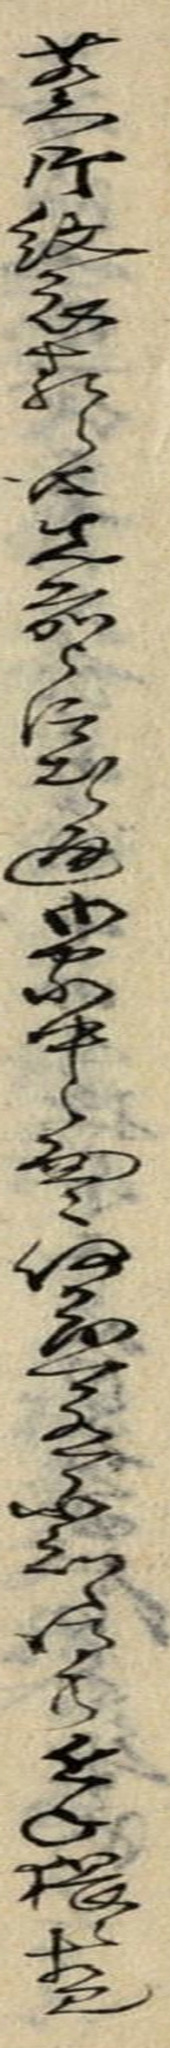葵御紋衣類之儀先前被仰出候通御家中之面々何も可有承知候得共近年猥に相見
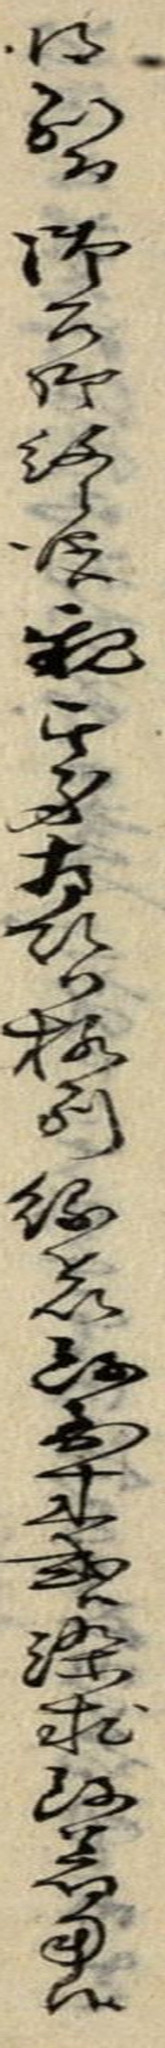得別而御召御紋之儀は親其身拝領は格別縁を以致到来或は染求致着用候
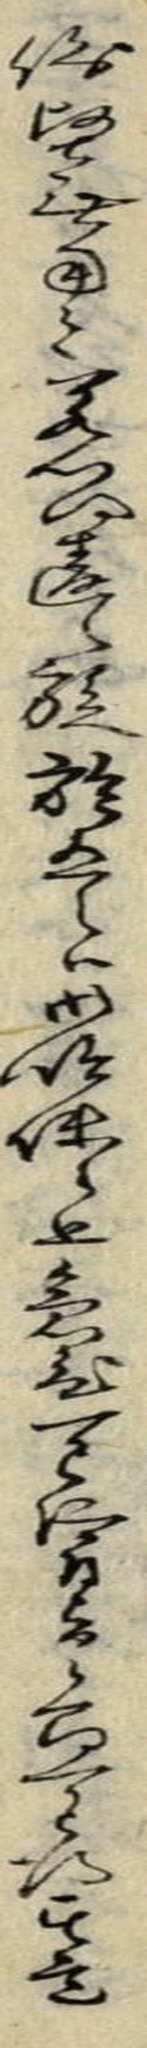儀堅無用に候若心得違之族於有之は御吟味之上急度可被仰付旨候間可被得其意
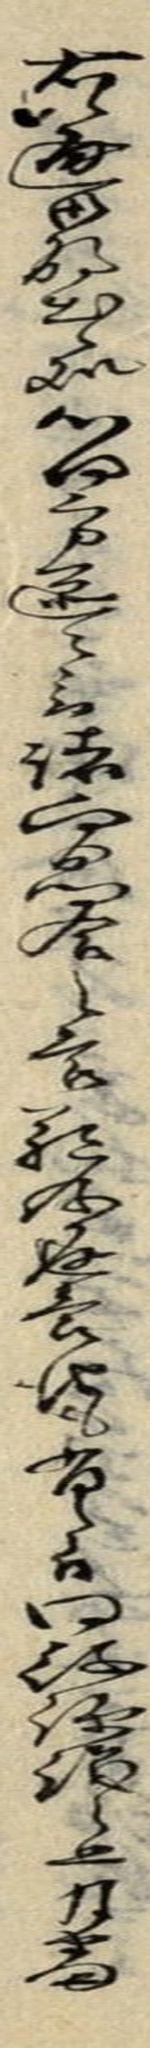右之通御触出候処心得方区々に而諸向ゟ問合之節難致返答儀も有之候付同役評議之上月番
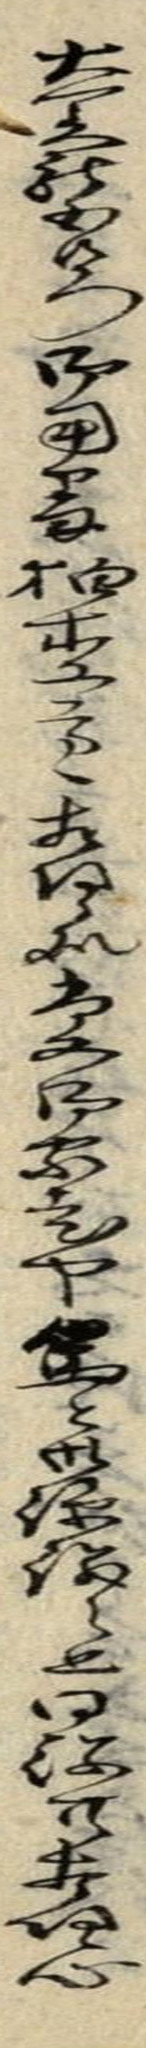大関新五左衛門御用番狛木工方へ相伺候処尚又御家老中篤と御評議之上同役共相伺候心
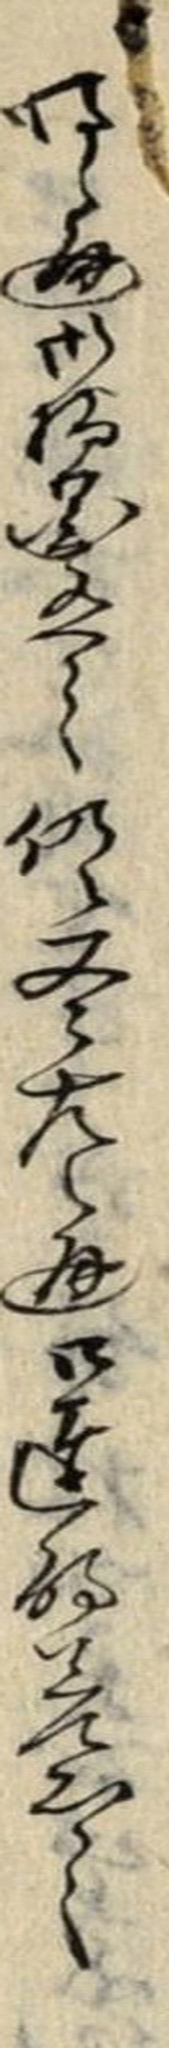得之通御指図有之仍之又々左之通御達触差出之
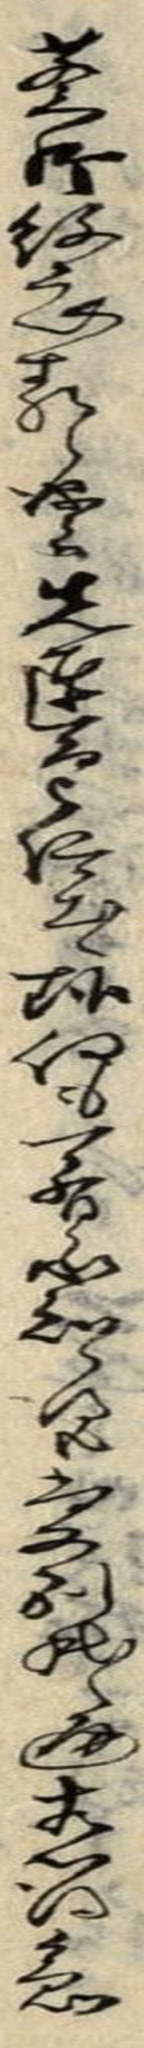葵御紋衣類之儀に付先達而被仰出候趣何も可有承知候得共尚又別紙之通相心得急
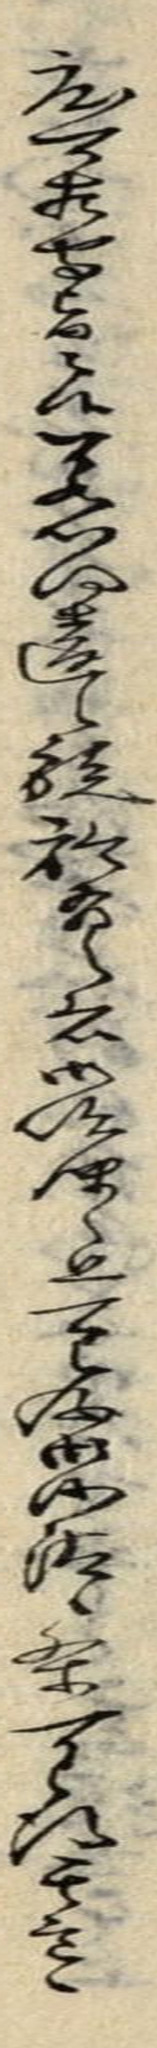度可相守旨に候若心得違之族於有之は御吟味之上可被及御沙汰候条可被得其意候
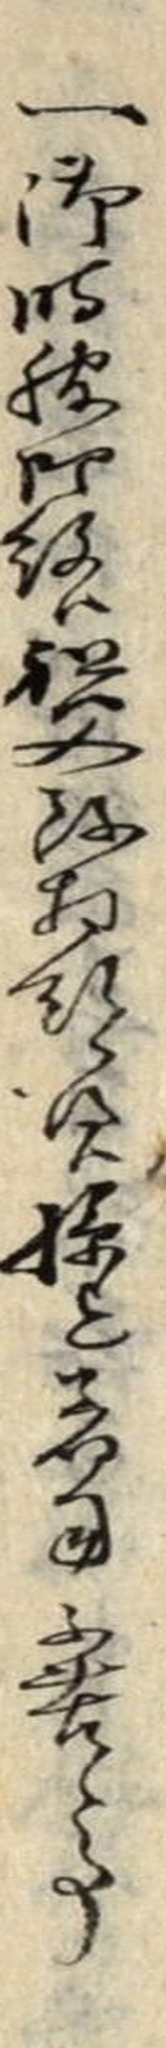一御時服御紋は祖父致拝領候得は孫迄着用不苦候事
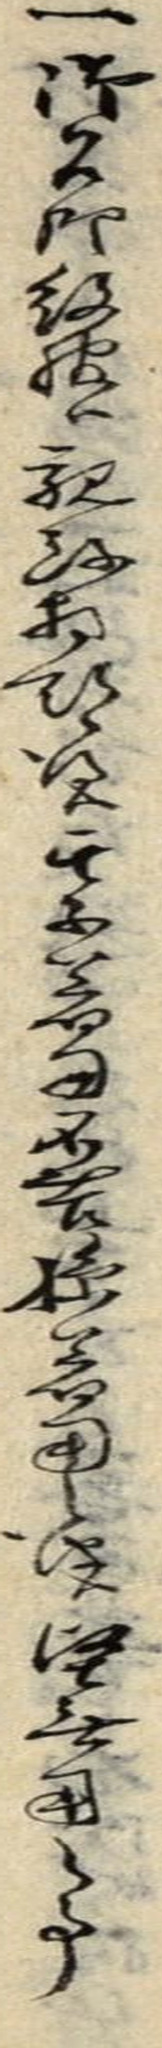一御召御紋服は親致拝領候得は其子着用不苦孫着用之儀は堅無用之事
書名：蒐輯之部
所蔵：福井県文書館 Fukui Prefectural Archives
